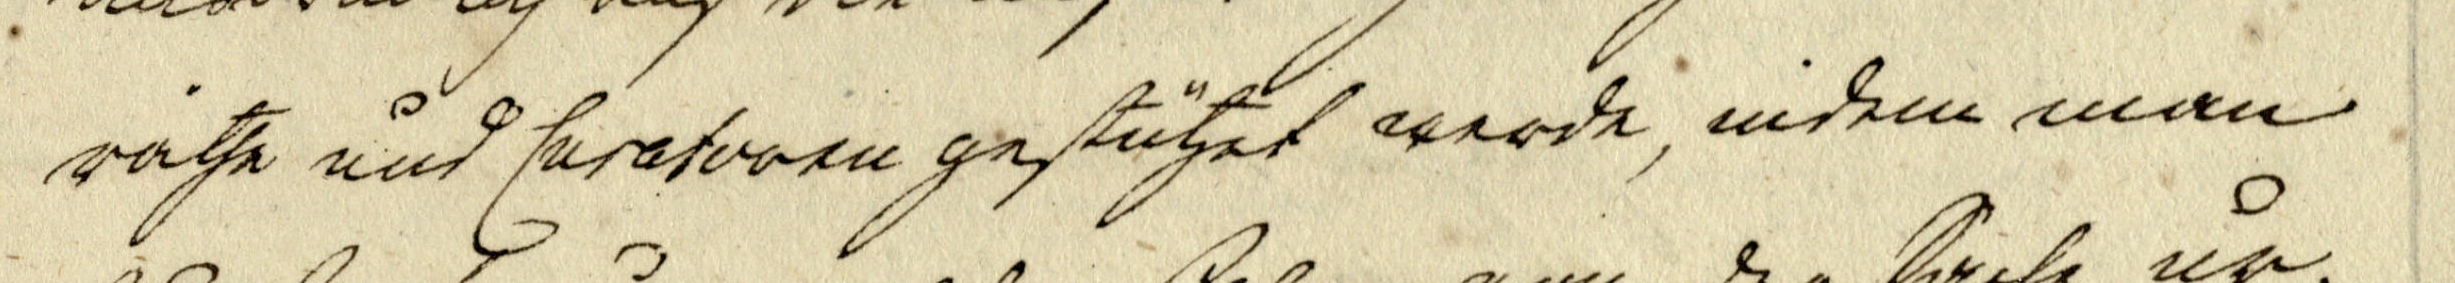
räthe und Curatoren gestützet werde, indem man
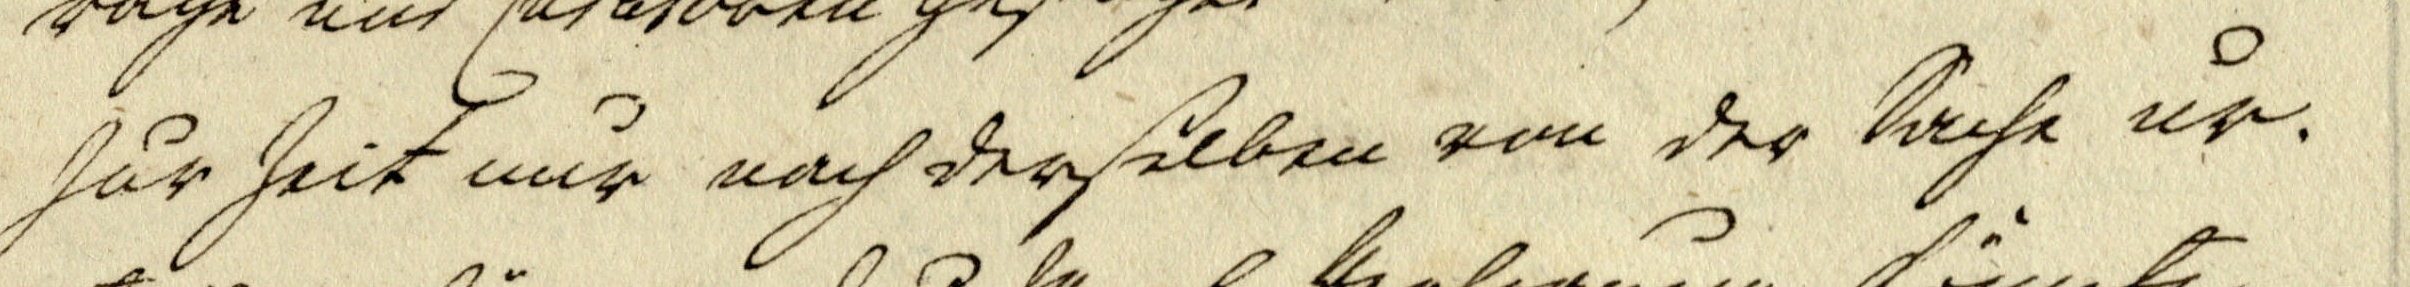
zur Zeit nur nach derselben von der Sache ur¬
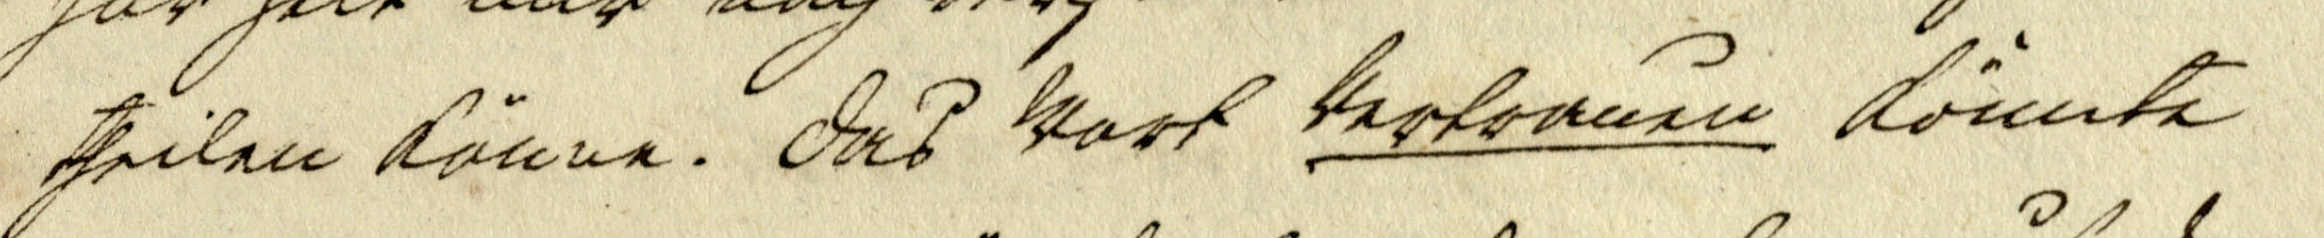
theilen könne. Das Wort Vertrauen könnte
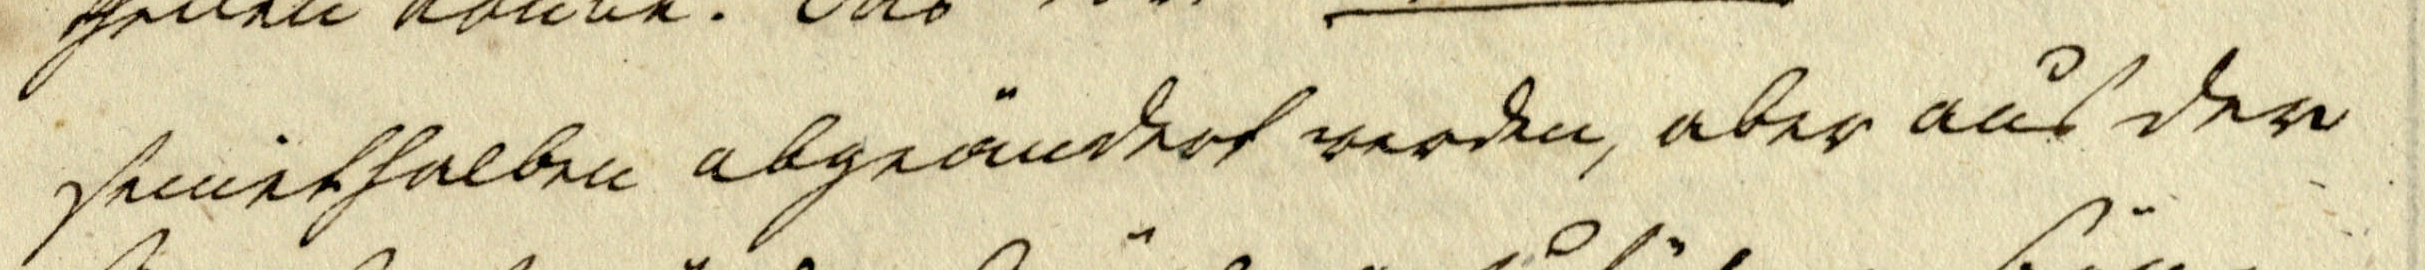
seinethalben abgeändert werden, aber aus der
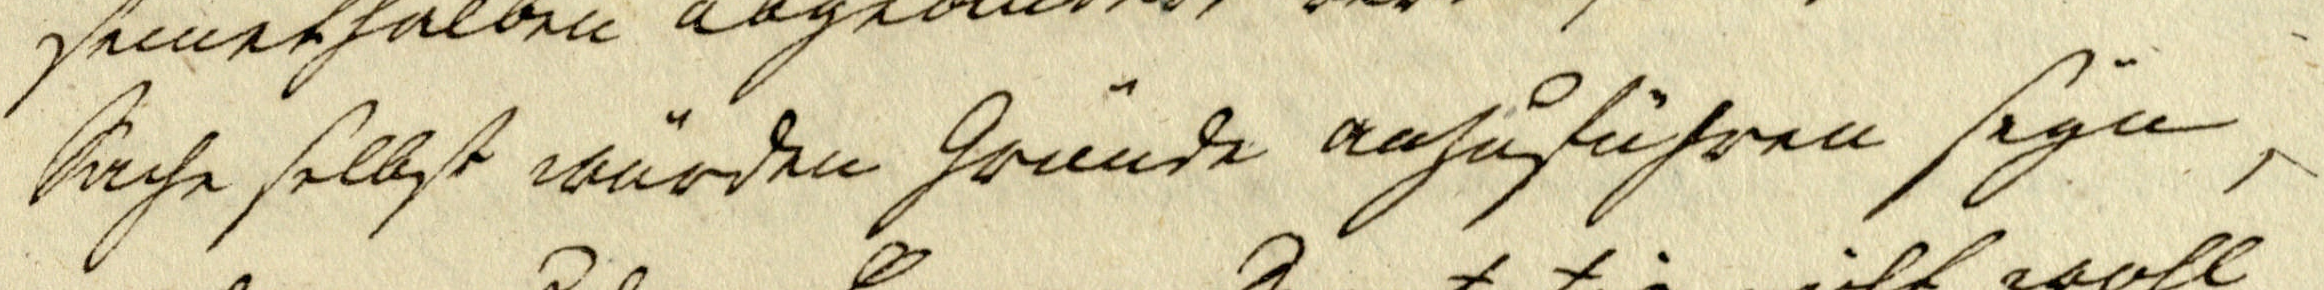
Sache selbst würden Gründe anzuführen seÿn,
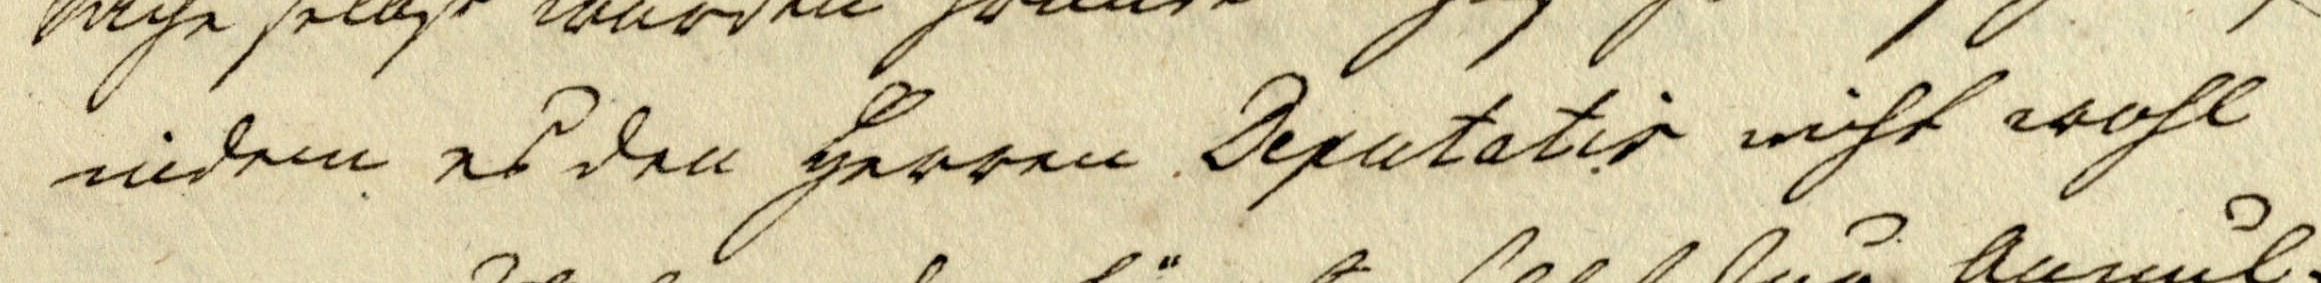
indem es den Herren Deputatis nicht wohl
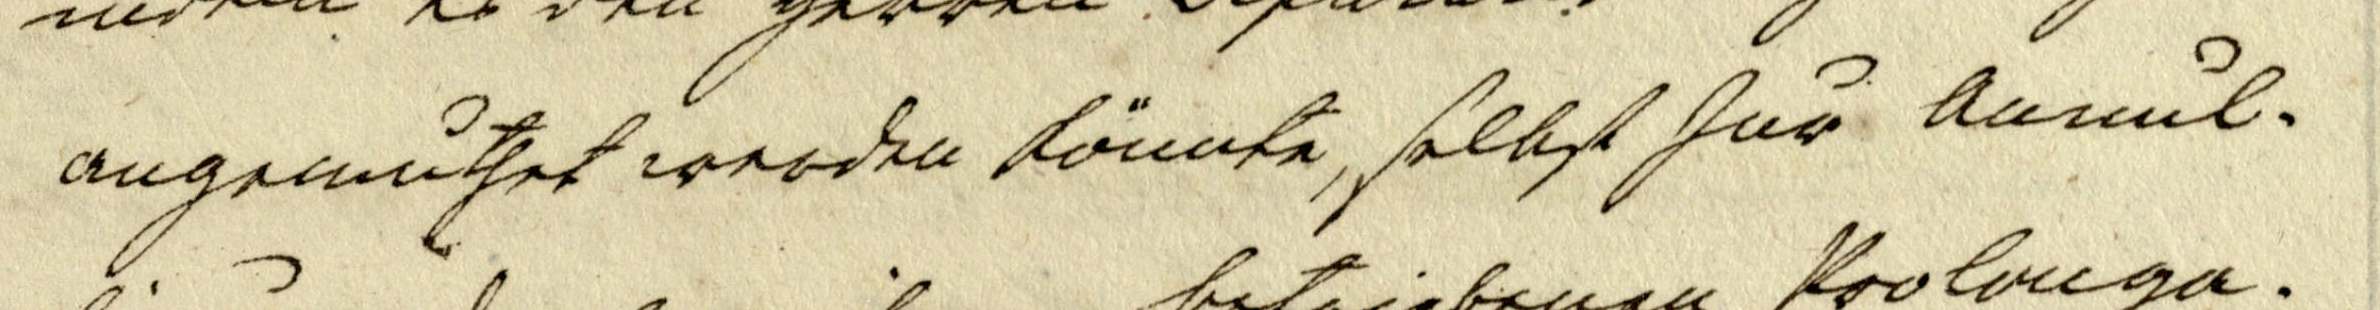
angemuthet werden könnte, selbst zur Annul¬
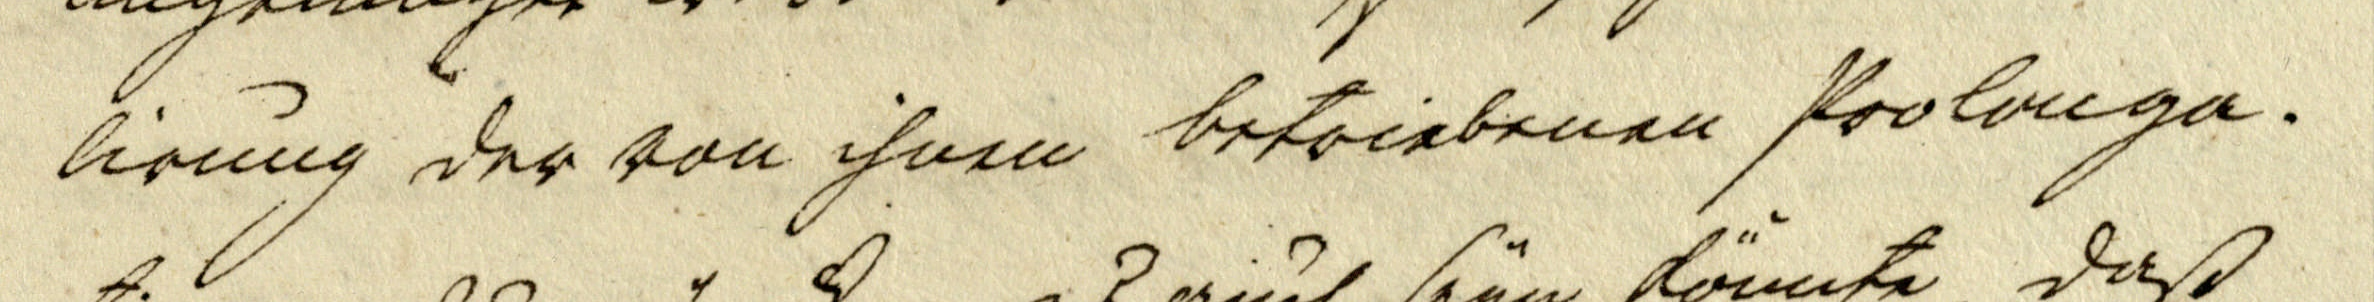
lirung der von ihnen betriebenen Prolonga¬
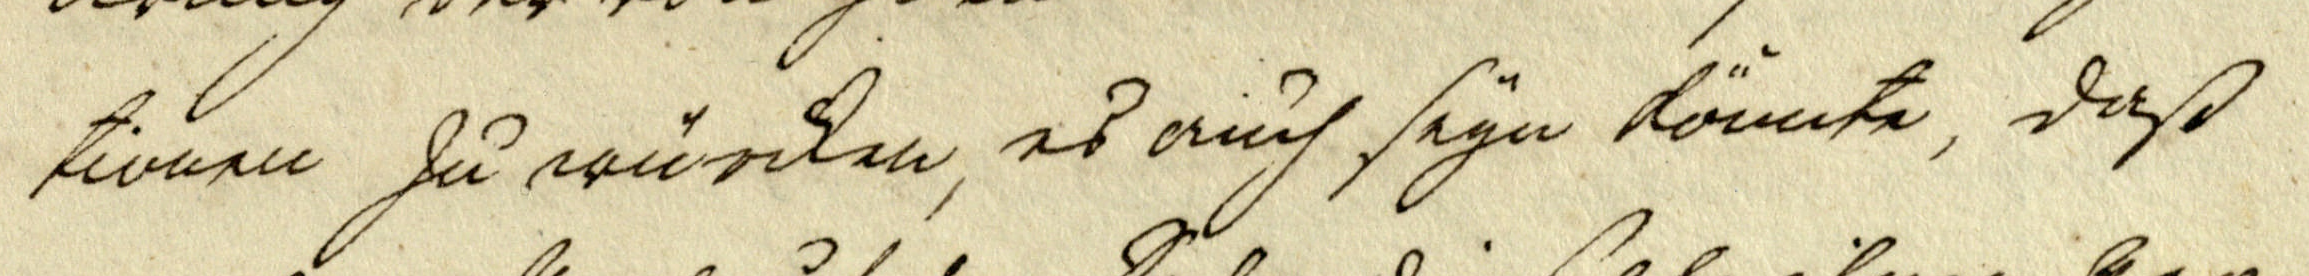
tionen zu würcken, es auch seÿn könnte, daß
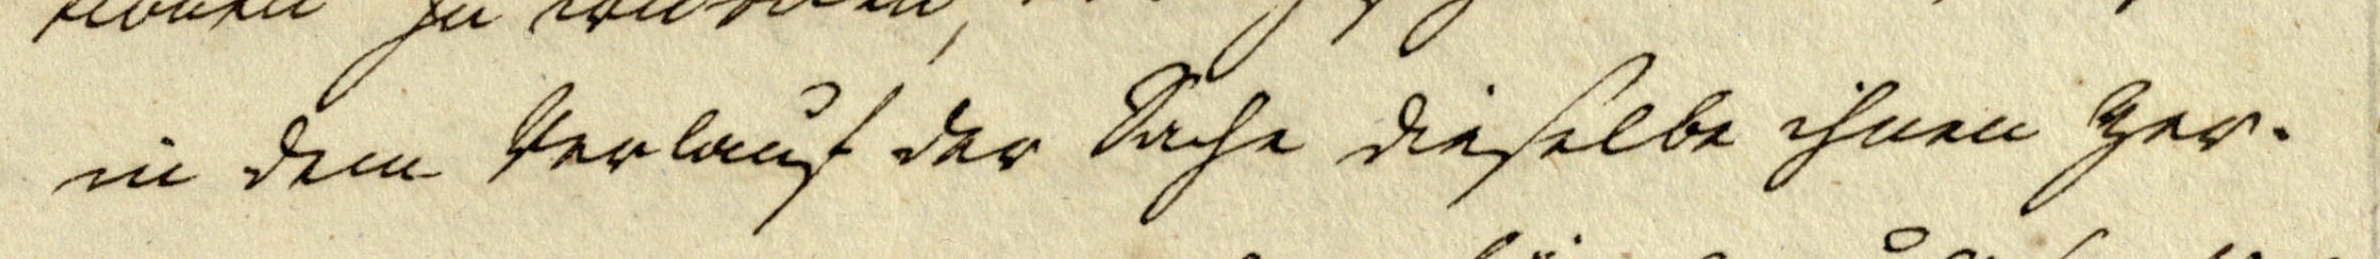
in dem Verlauf der Sache dieselbe ihnen per¬
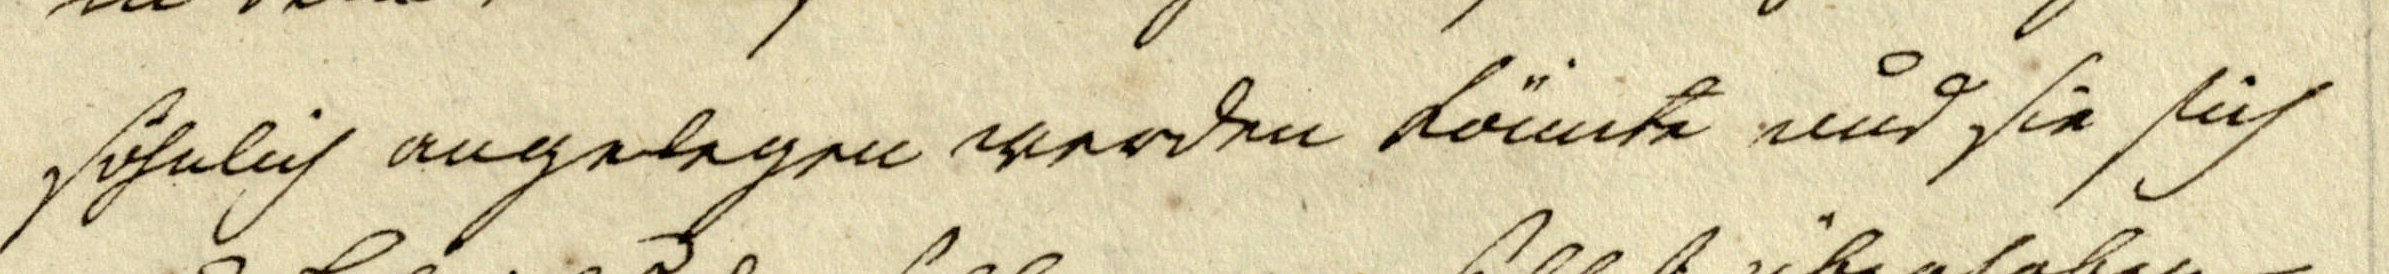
söhnlich angelegen werden könnte und sie sich
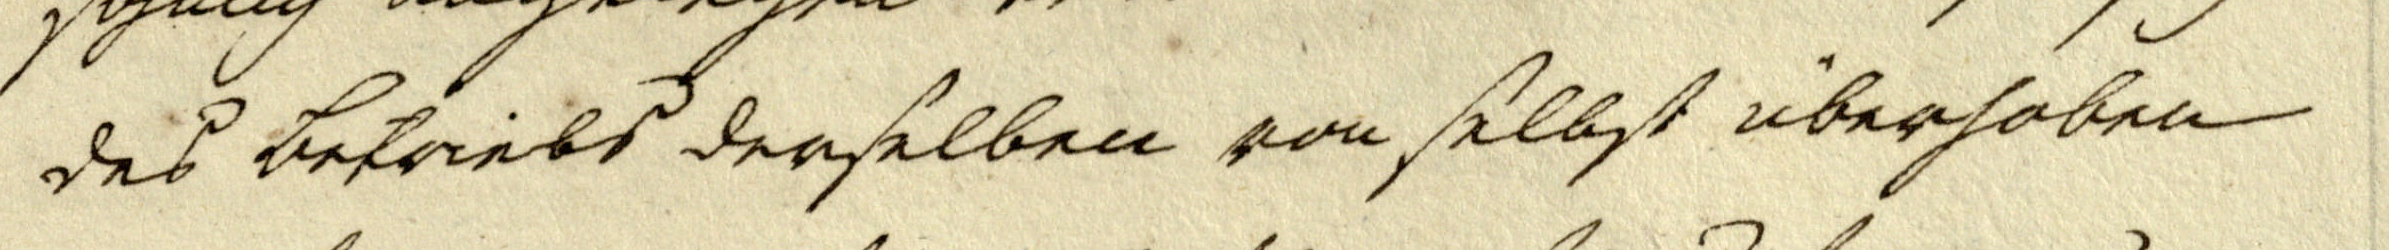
des Betriels derselben von selbst überhoben
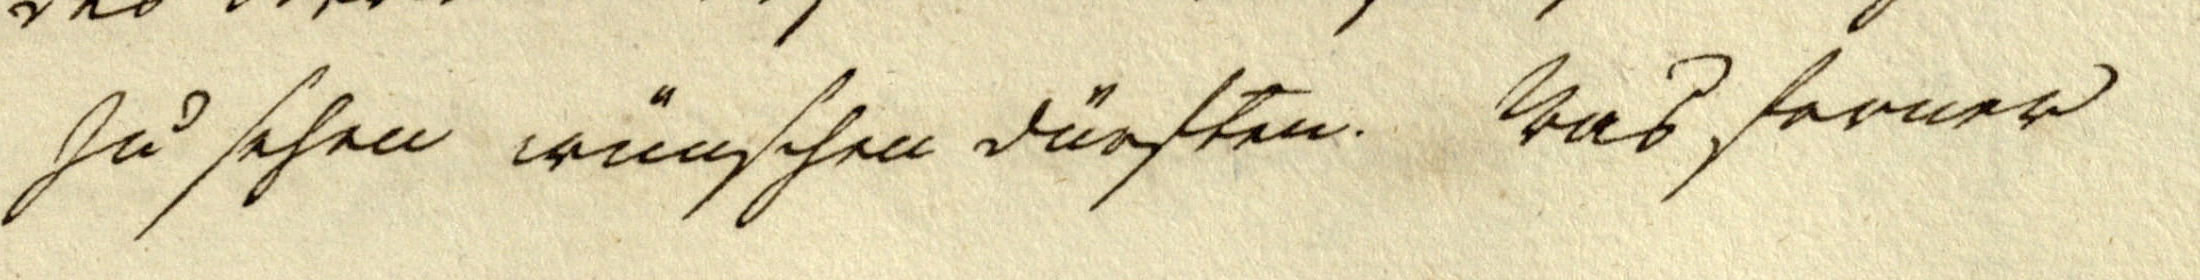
zu sehen wünschen dürften. Was ferner
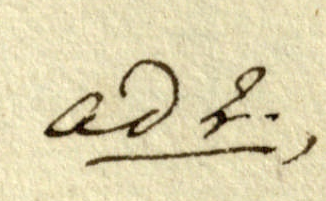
ad 2.,
